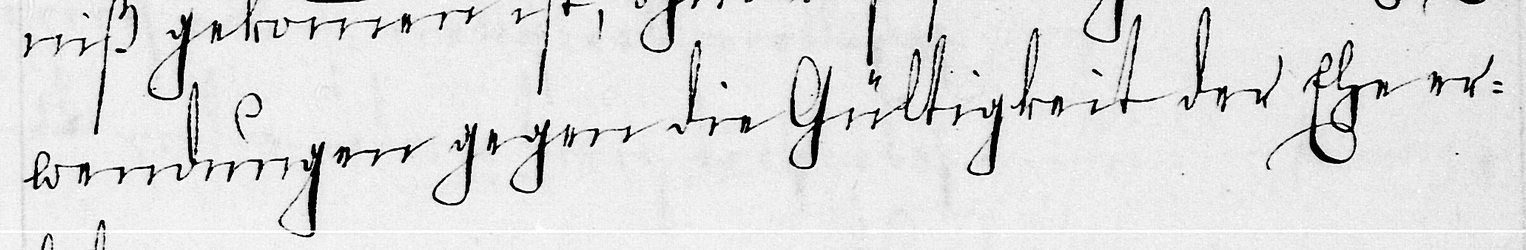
wendungen gegen die Gültigkeit der Ehe er¬
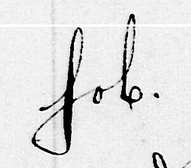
hob.
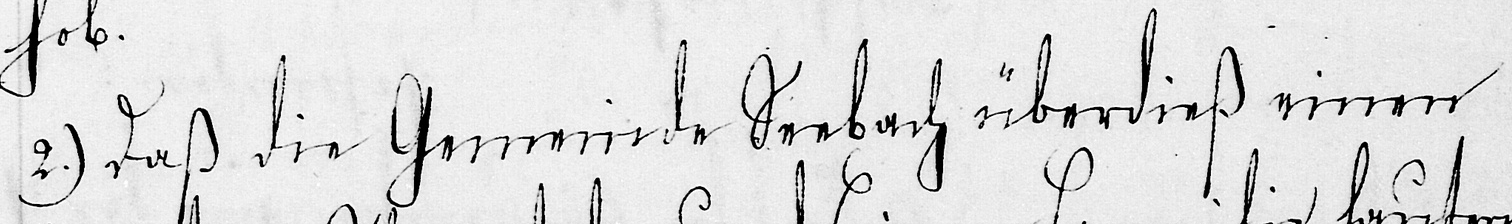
2.) Daß die Gemeinde Seebach überdieß einen
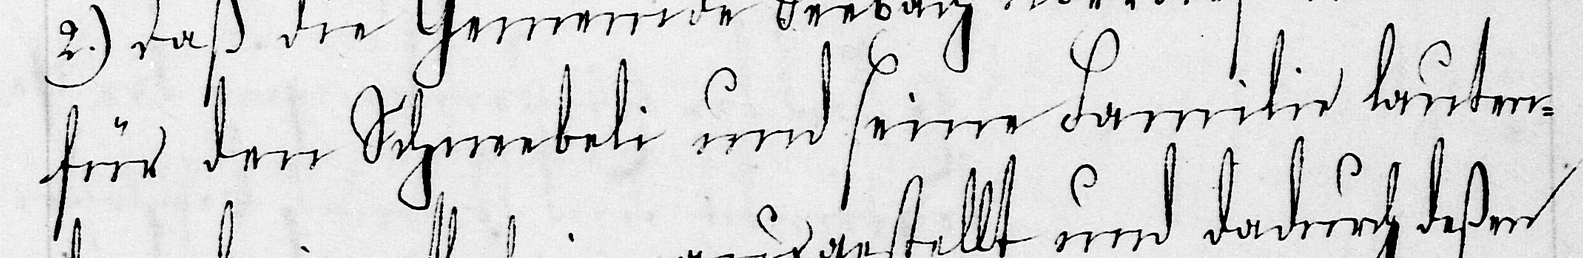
für den Schneebeli und seine Familie lauten¬
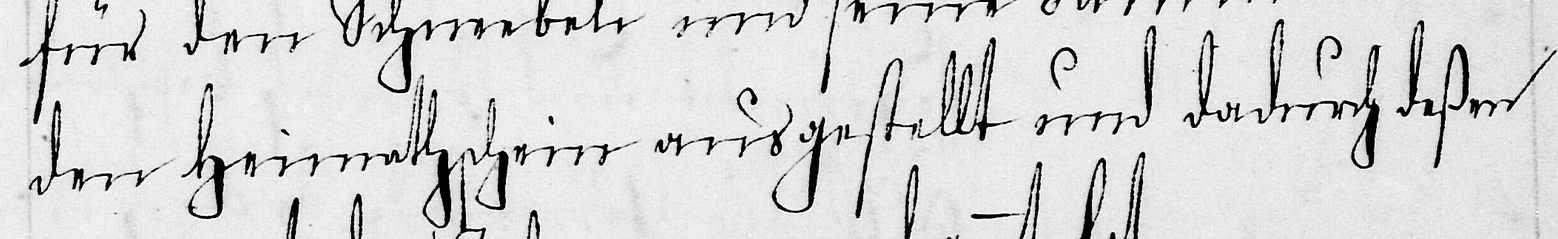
den Heimathschein ausgestellt und dadurch deßen
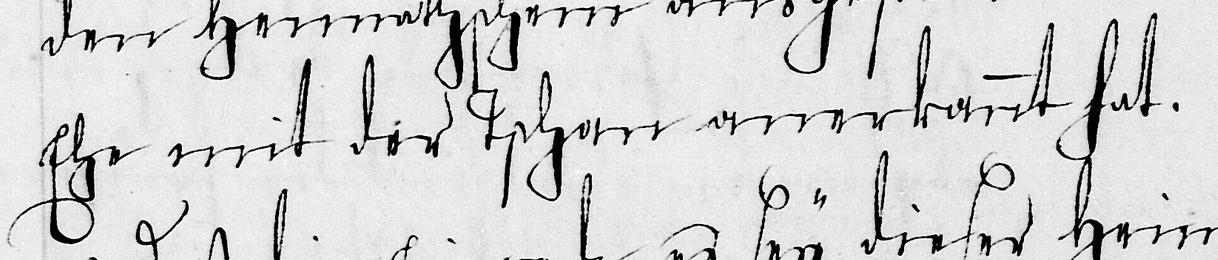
Ehe mit der Tschan anerkannt hat.
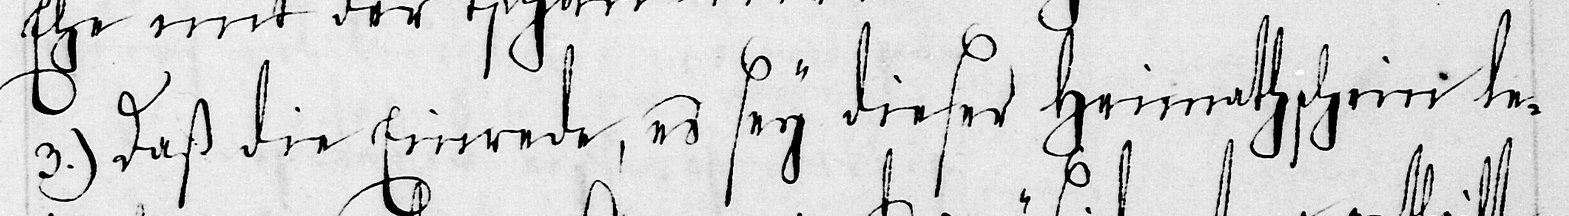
3.) Daß die Einrede, es sey dieser Heimathschein le¬
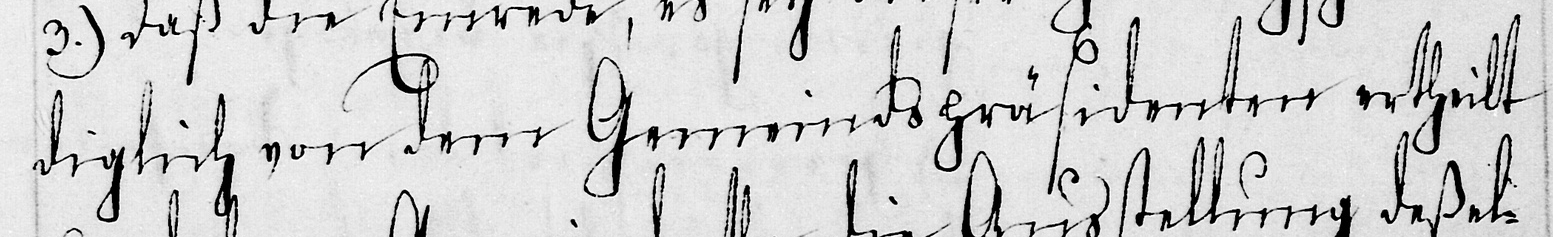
diglich von dem Gemeindspräsidenten ertheilt
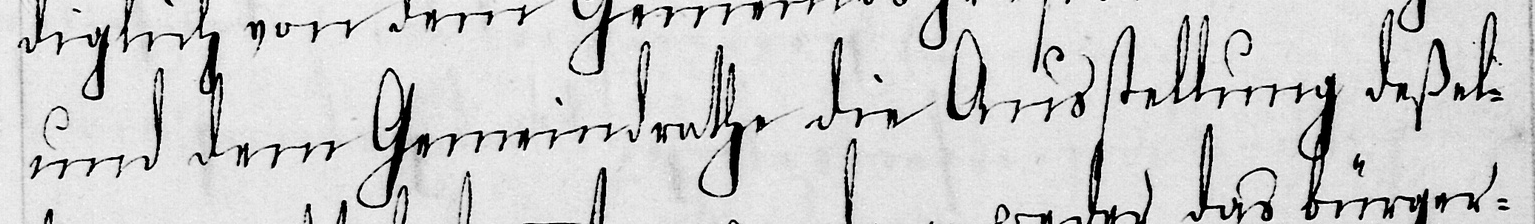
und dem Gemeindrathe die Ausstellung deßel¬
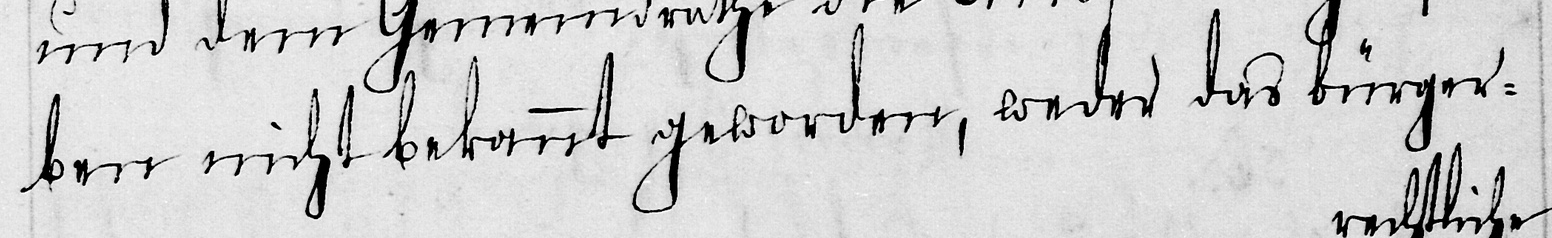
ben nicht bekannt geworden, weder das bürger-
